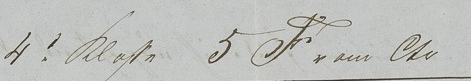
4t Klasse 5Fr vom Ctr
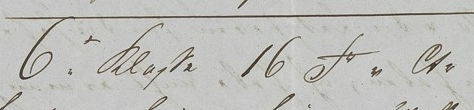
6t Klasse 16 Fr v Ctr
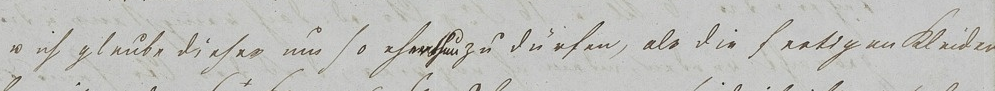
& ich glaube dieses um so eher thun zu dürfen, als die fertigen Kleider
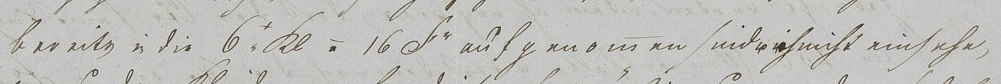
bereits in die 6t Kl à 16 Fr aufgenommen sind & ich nicht einsehe,
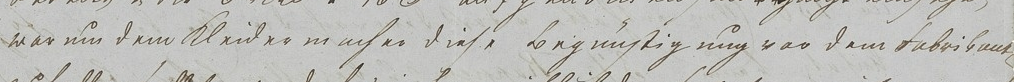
warum dem Kleidermacher diese Begünstigung vor dem Fabrikanten
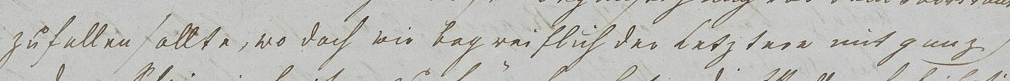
zufallen sollte, wo doch wie begreiflich der Letztere mit ganz
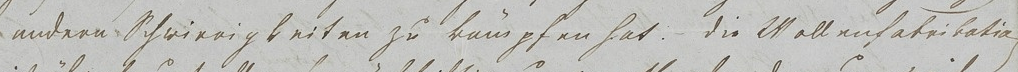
andern Schwierigkeiten zu kämpfen hat. – Die Wollenfabrikation
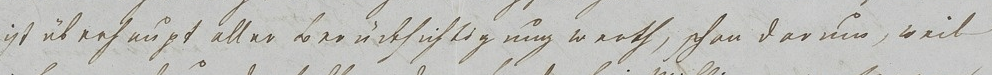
ist überhaupt aller Berücksichtigung werth, schon darum, weil
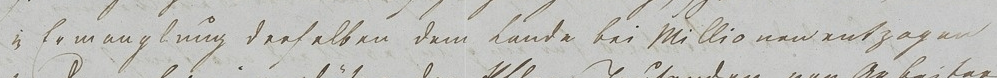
in Ermanglung derselben dem Lande bei Millionen entzogen
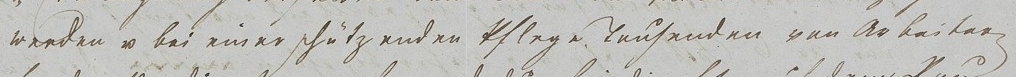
werden & bei einer schützenden Pflege v. Tausenden von Arbeitern
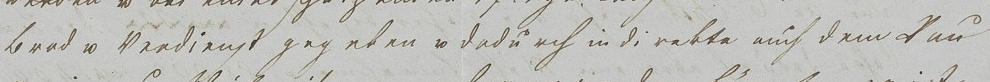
Brod & Verdienst gegeben & dadurch indirekte auch dem Pau-
